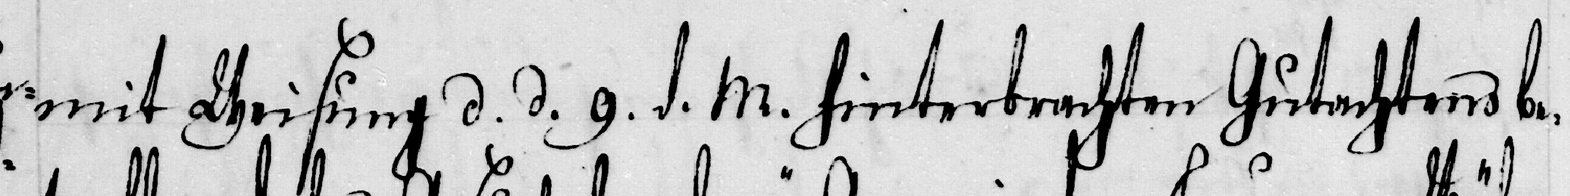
mit Weisung d. d. 9. d. M. hinterbrachten Gutachtens b¬
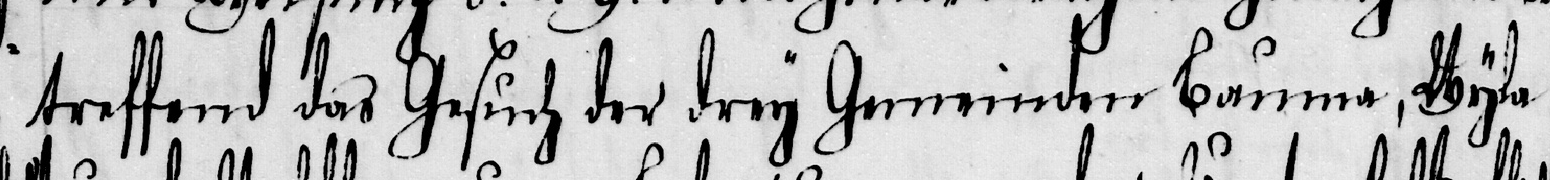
etreffend das Gesuch der drey Gemeinden Bauma, Wyla
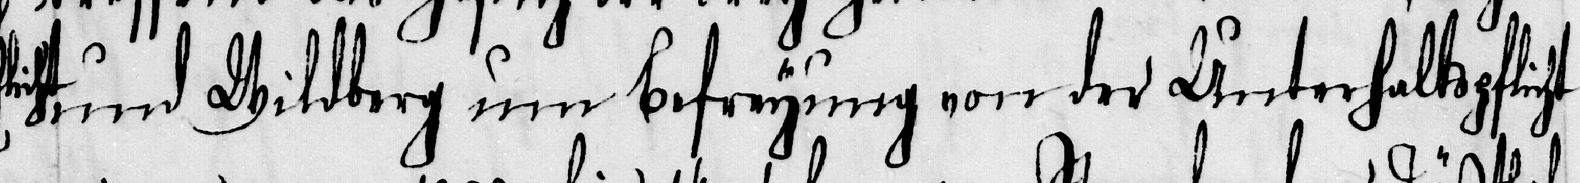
und Wildberg um Befreyung von der Unterhaltspfli¬
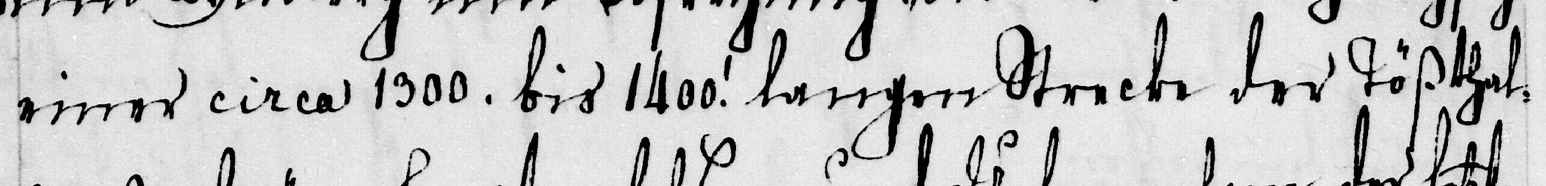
einer circa 1300. bis 1400.‘ langen Strecke der Tößthal¬
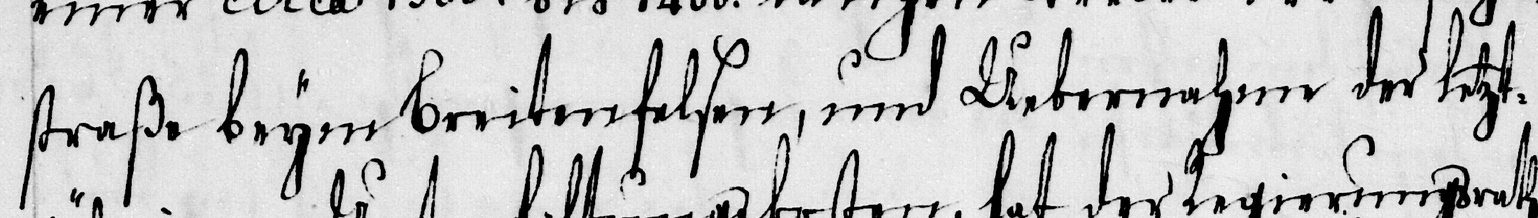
straße beym Breitenfelsen, und Uebernahme der letz¬
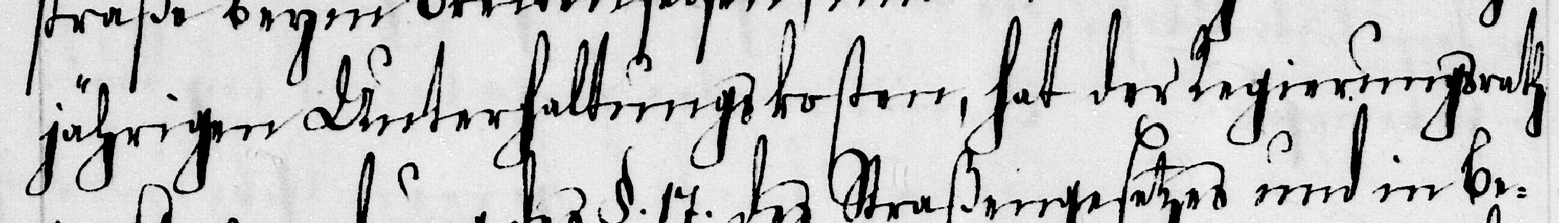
tjährigen Unterhaltungskosten, hat der Regierungsrath
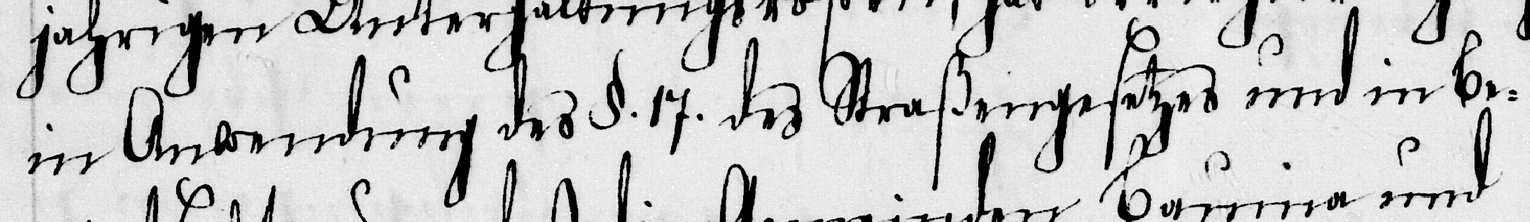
in Anwendung des §. 17. des Straßengesetzes und in Be¬
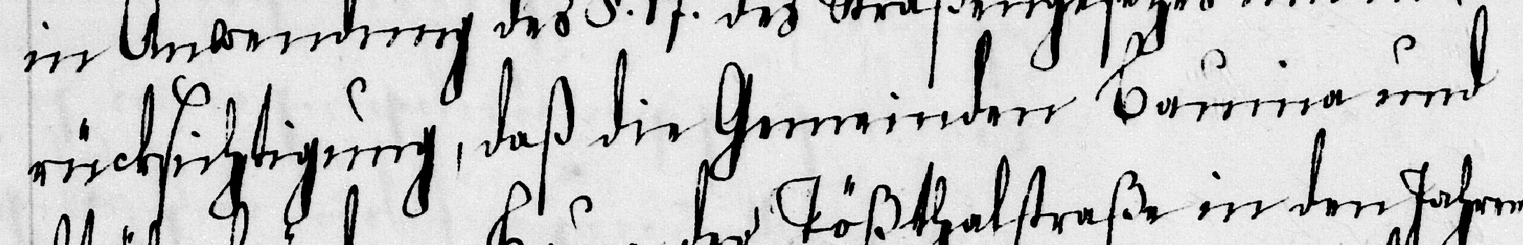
rücksichtigung, daß die Gemeinde Bauma und
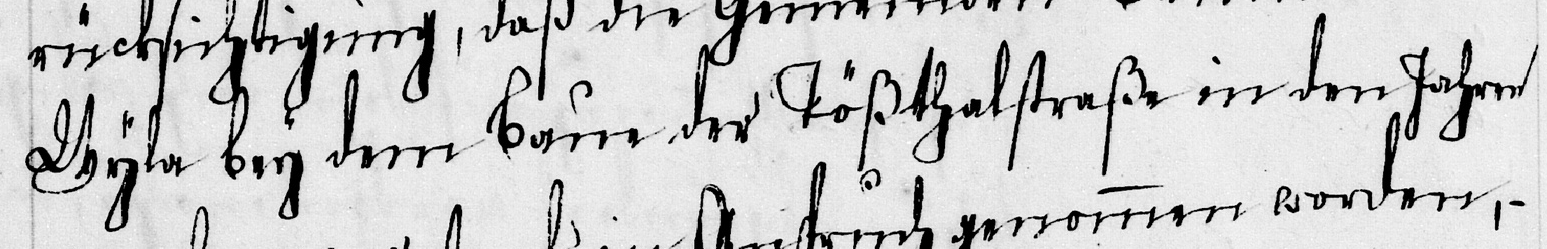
Wyla bey dem Bau der Tößthalstraße in den Jahren
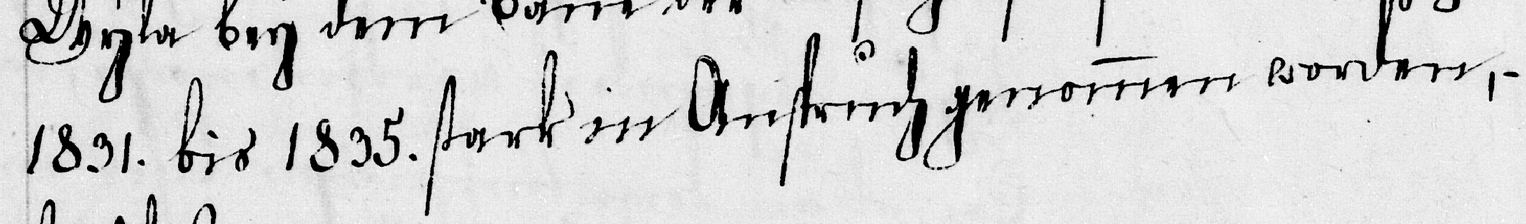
1831. bis 1835. stark in Anspruch genommen worden,
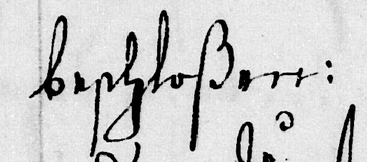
beschloßen:
